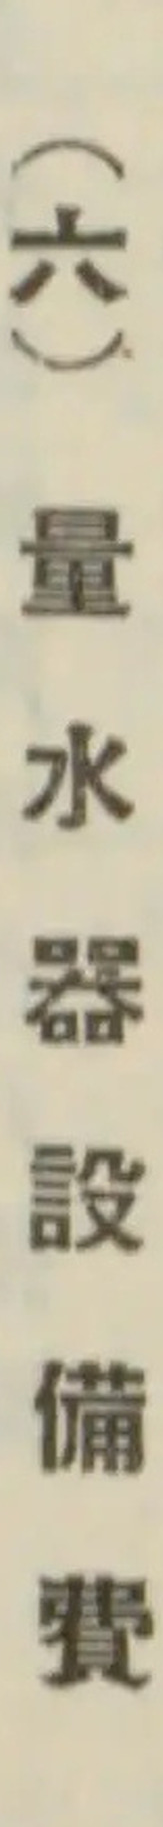(六)量水器設備費
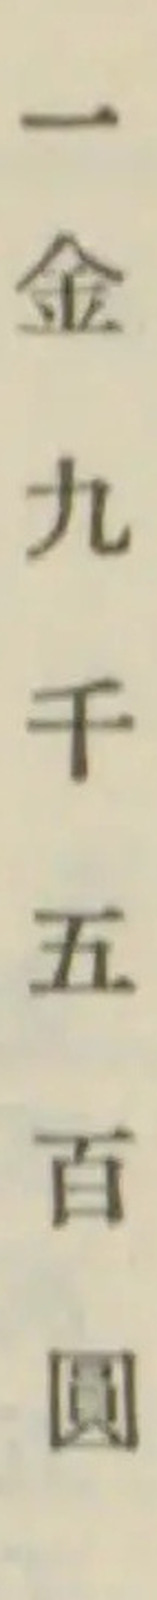一金九千五百圓
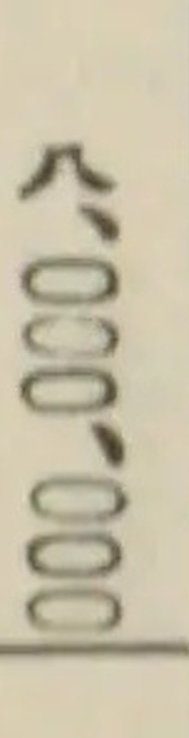計九、五〇〇、〇〇〇
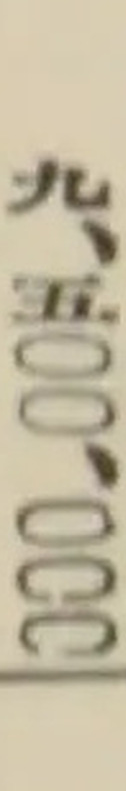計九、五〇〇、〇〇〇

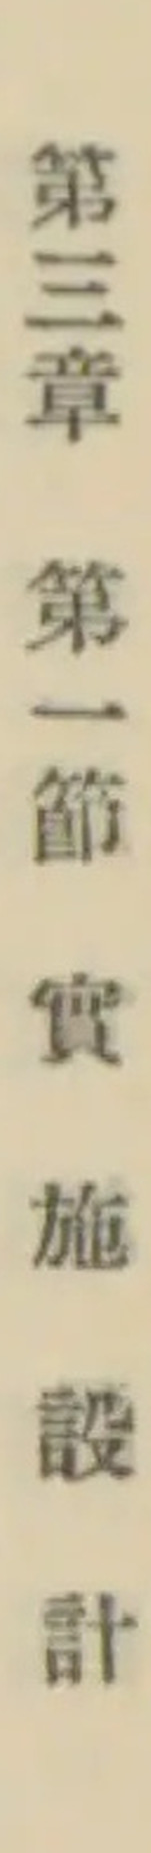第三章第一節実施設計
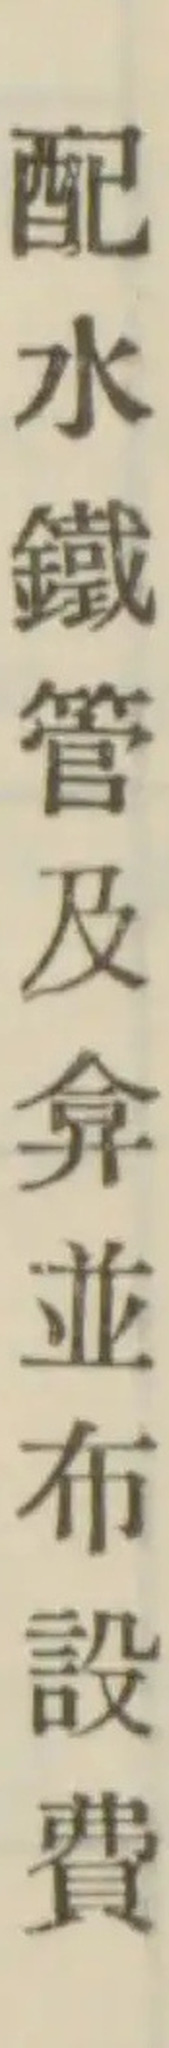配水鐵管及弇並布設費
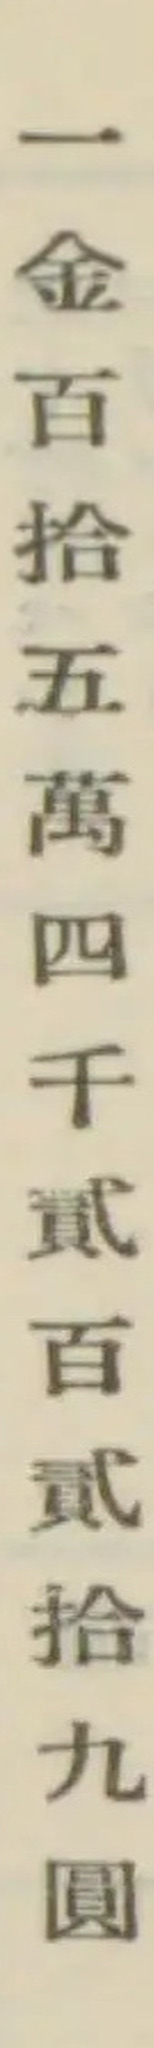一金百十五萬四千貳百拾九圓
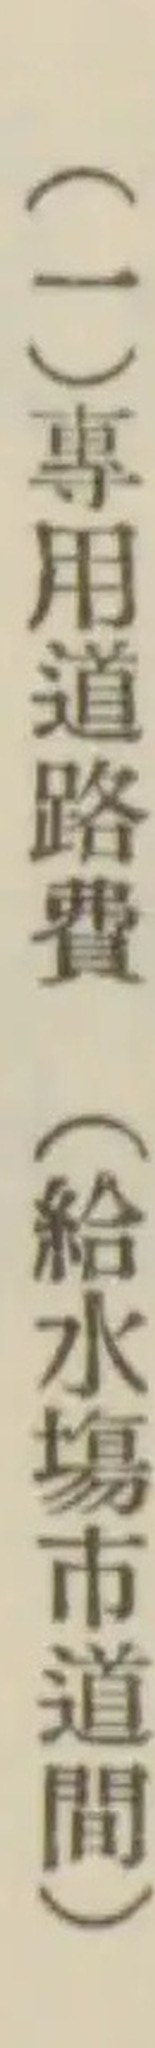(一)専用道路費(給水場市道間)
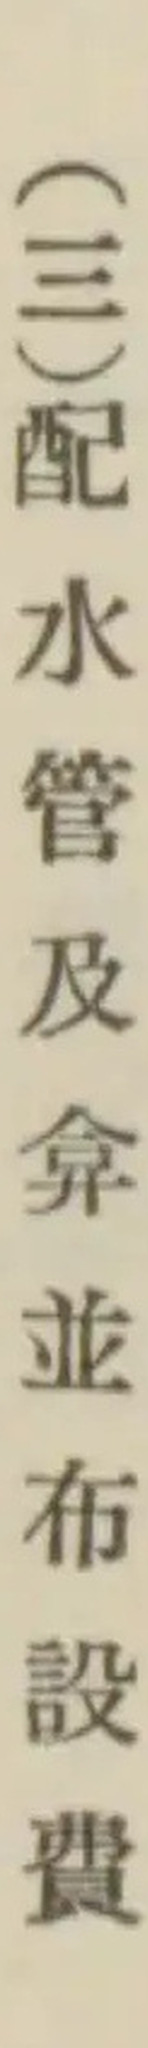配水鐵管及弇並布設費
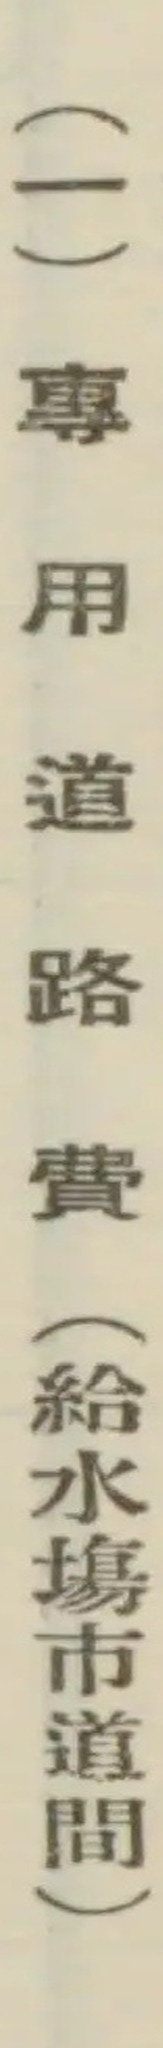(一)専用道路費(給水場市道間)
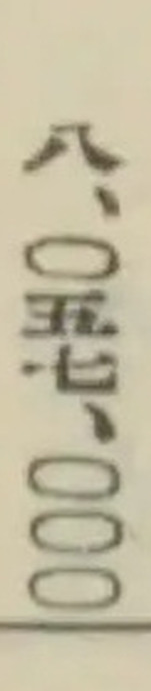計八、〇五七、〇〇〇
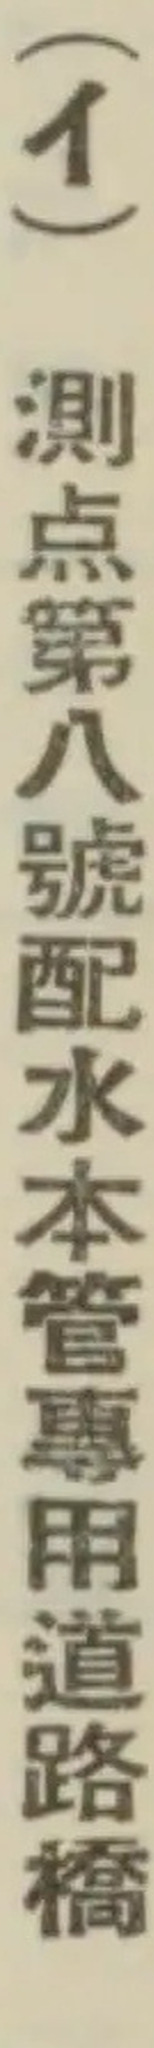(イ)測点第八号配水本管専用道路橋
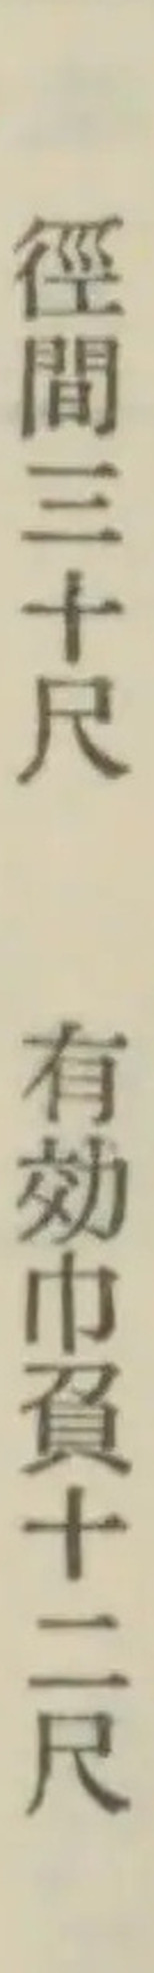径間三十尺有効巾負十二尺

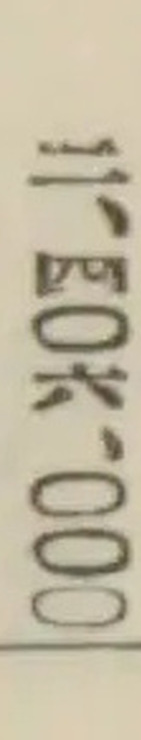計二、四〇六、〇〇〇
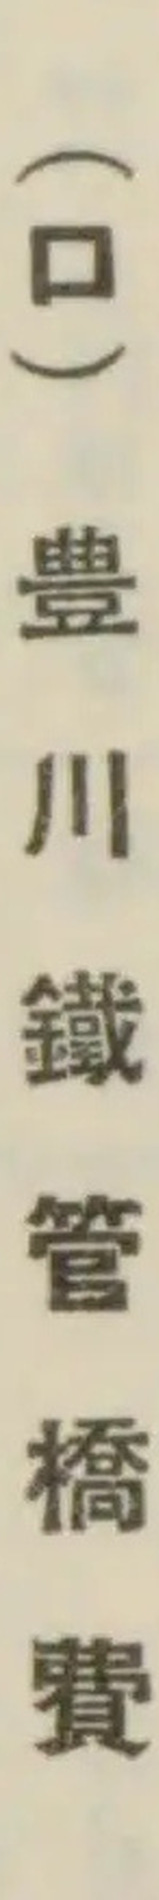(ロ)豊川鐵管橋費
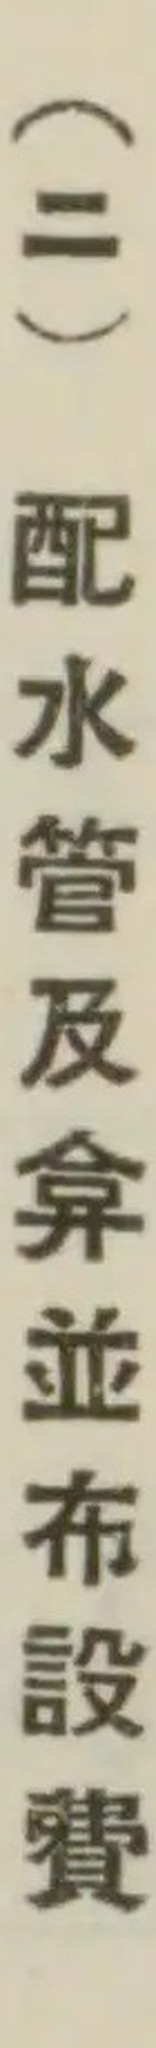(二)配水管及弇並布設費
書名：豊橋市水道誌
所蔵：国立国会図書館 National Diet Library, JAPAN
